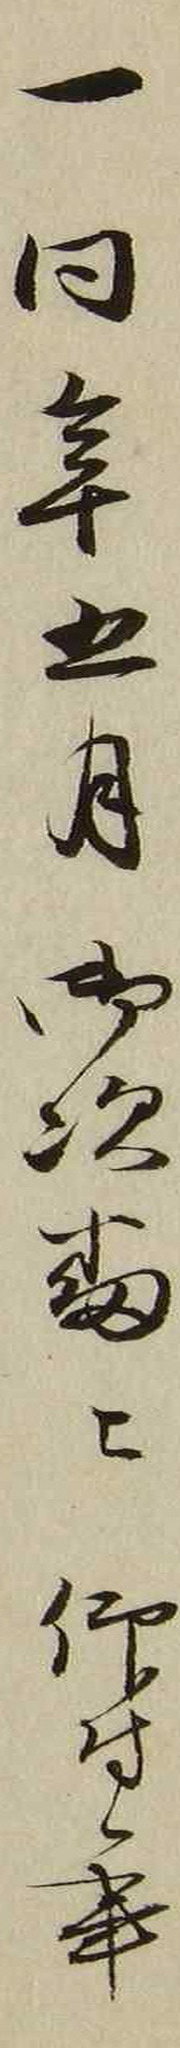一同年五月御次番被仰付候事
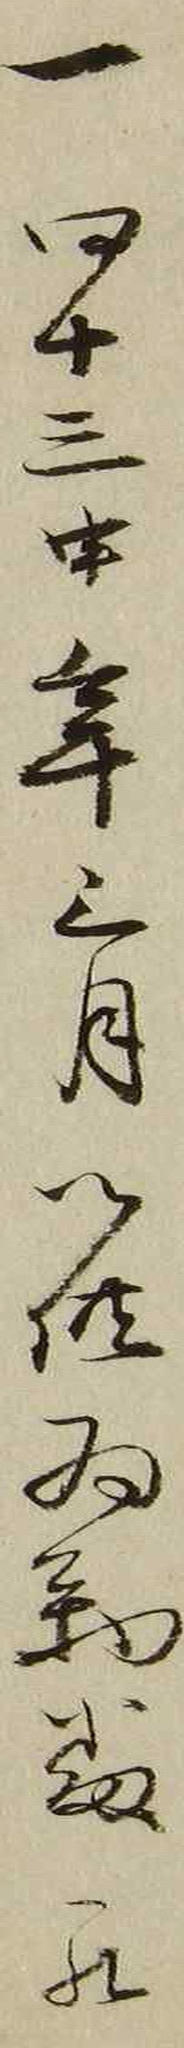一同十三申年三月御供為勤番罷
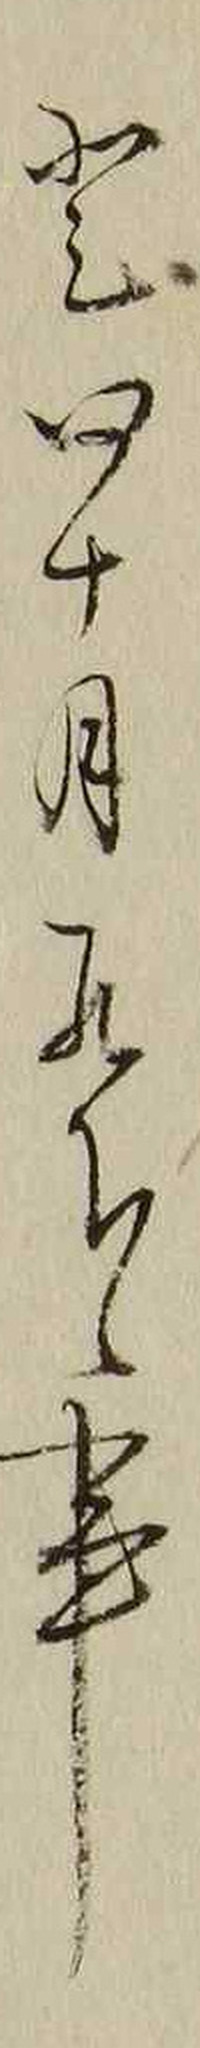登同十月罷下候事
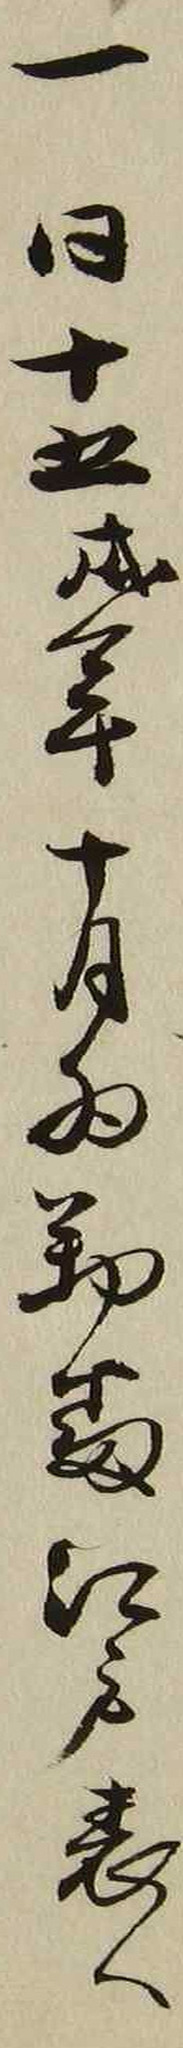一同十五戌年十月為勤番江戸表へ
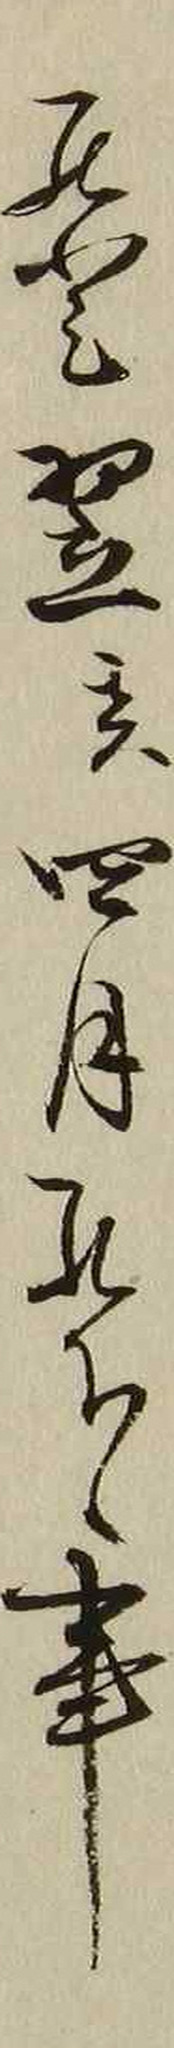罷登翌亥四月罷下候事
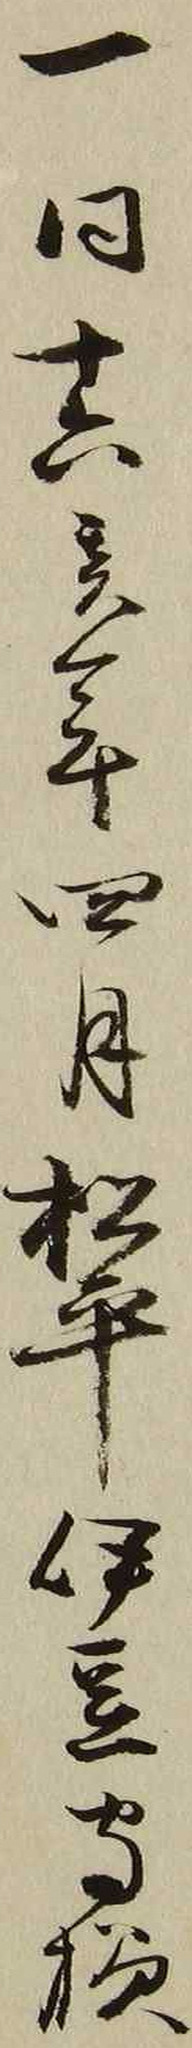一同十六亥年四月松平伊豆守様
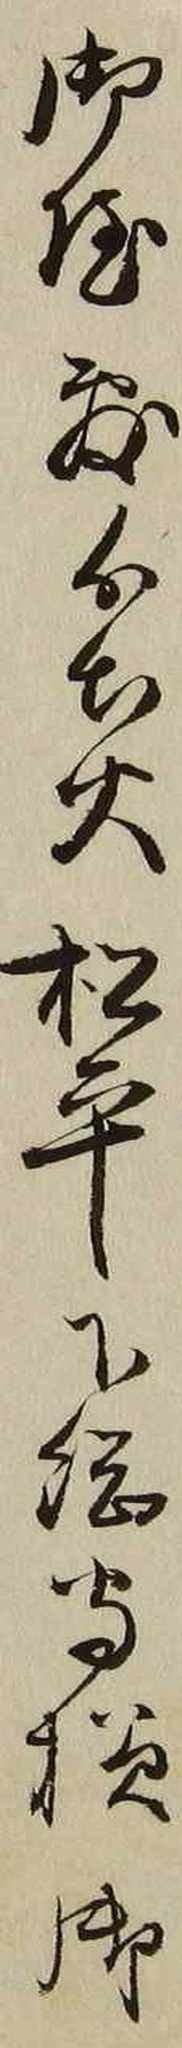御屋敷ゟ出火松平下総守様御
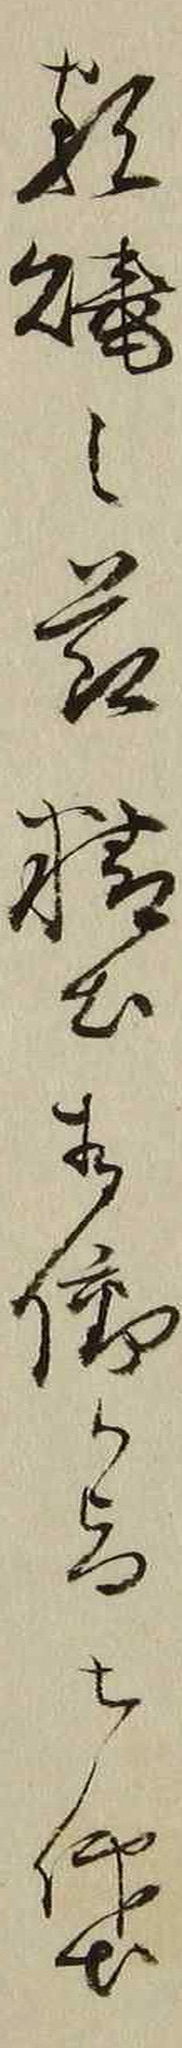類焼之節精出相勤候旨被仰出
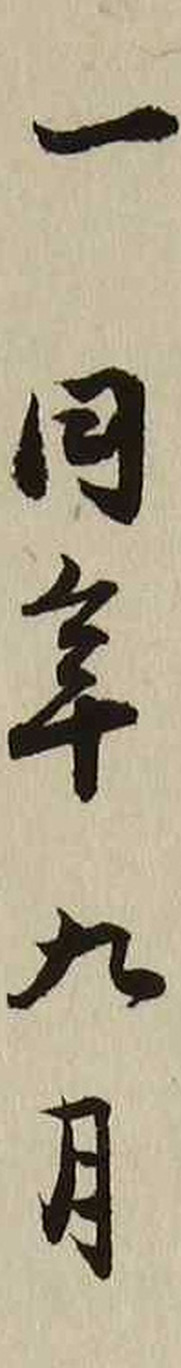一同年九月
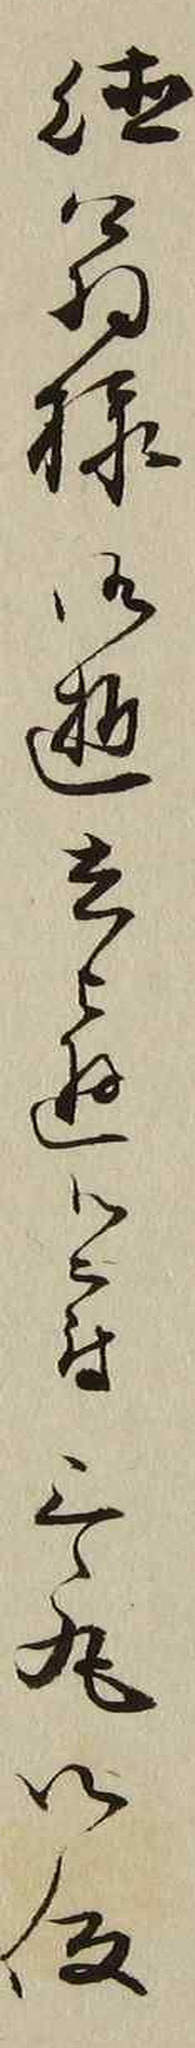徳翁様御逝去被遊候に付三之丸御仮
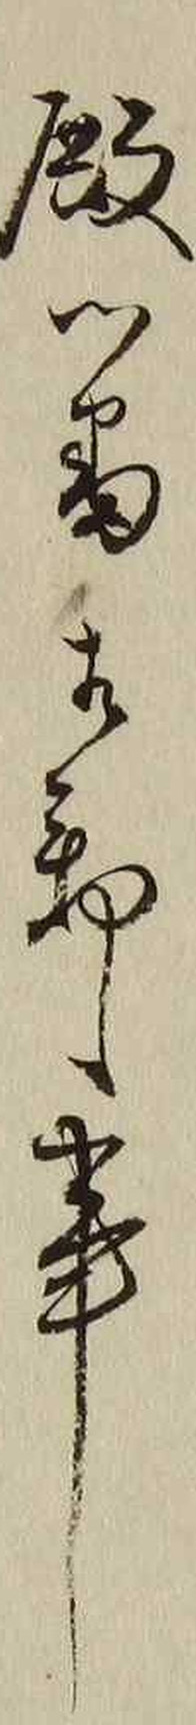殿御番相勤候事
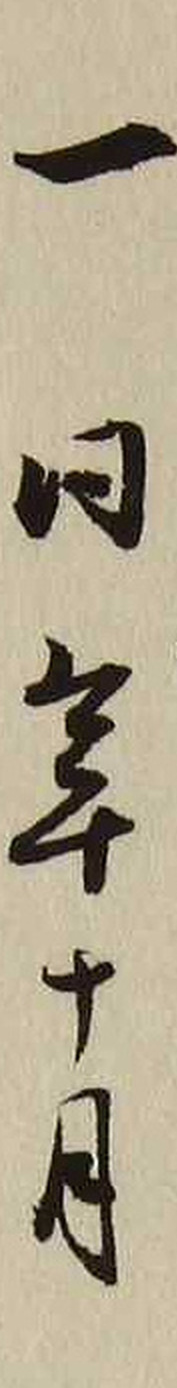一同年九月
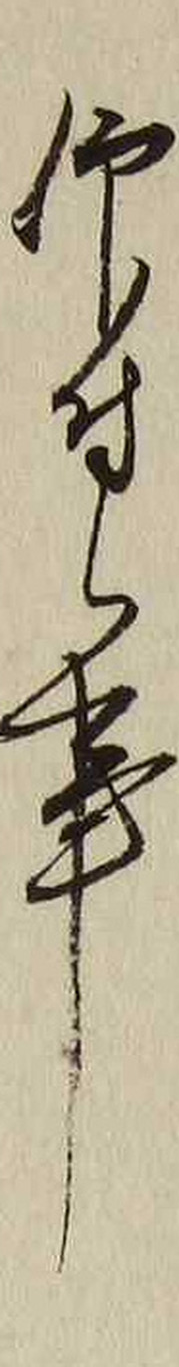仰付候事
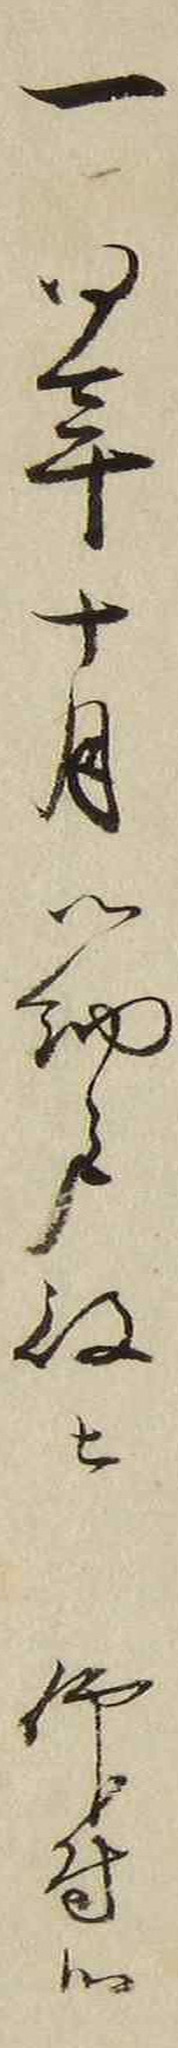一同年十月御納戸役被仰付候

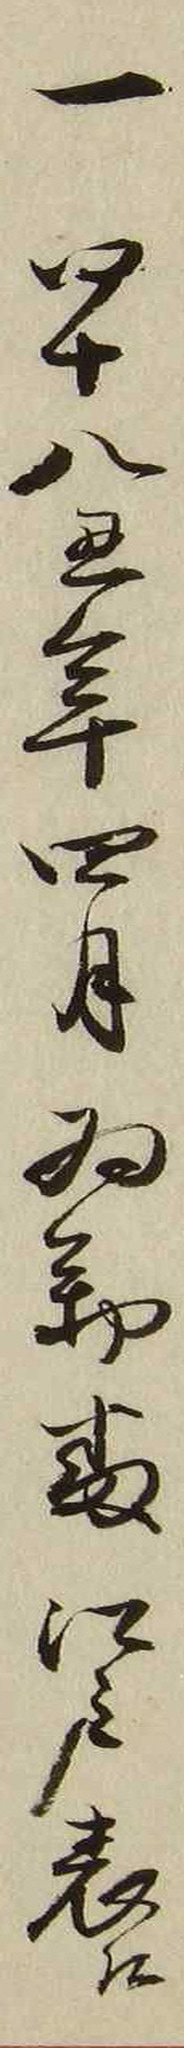一同十八丑年四月為勤番江戸表江
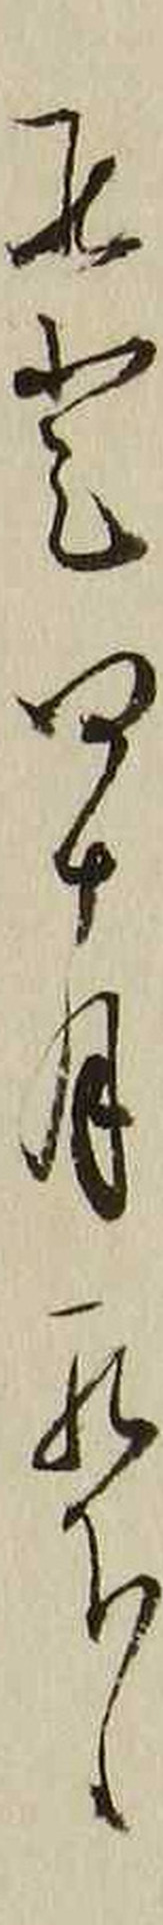罷登同十月罷下候
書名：諸士系譜　巻之292　き之部1
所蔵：会津若松市立会津図書館
